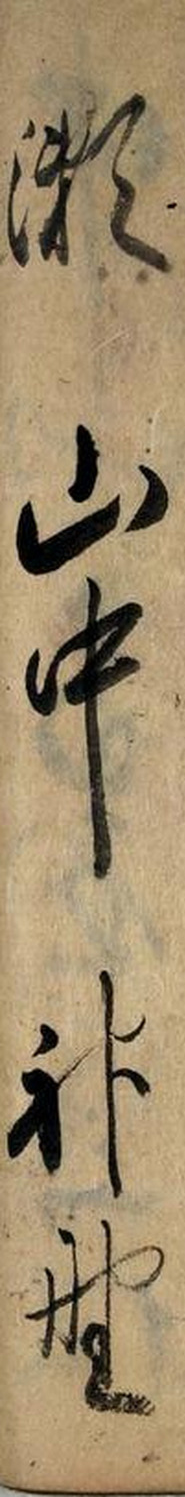瀬山中神野
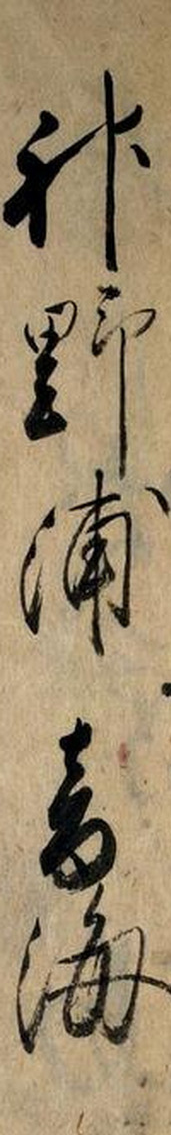神野浦音海
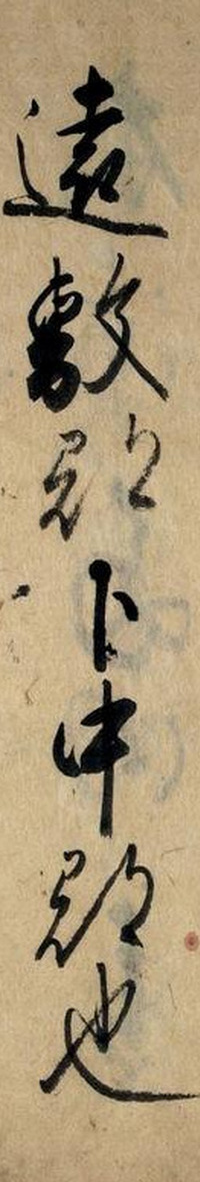遠敷郡下中郡也
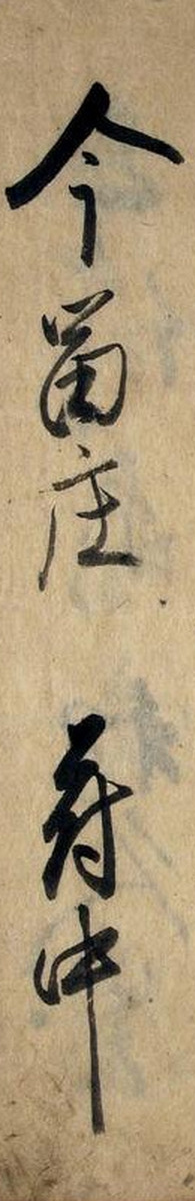今富庄府中

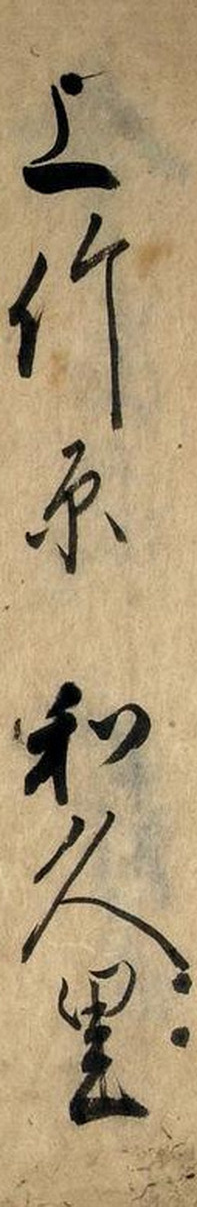上竹原和久里
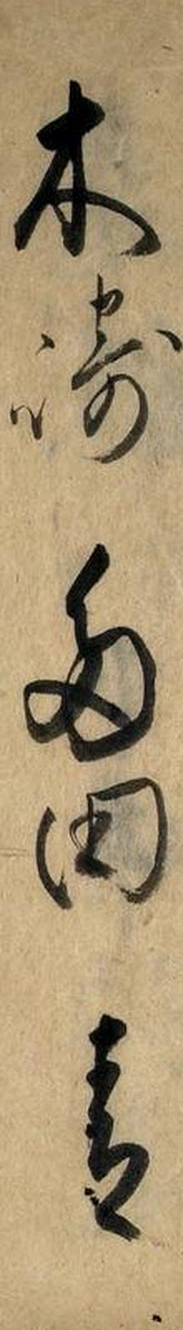木崎多田青
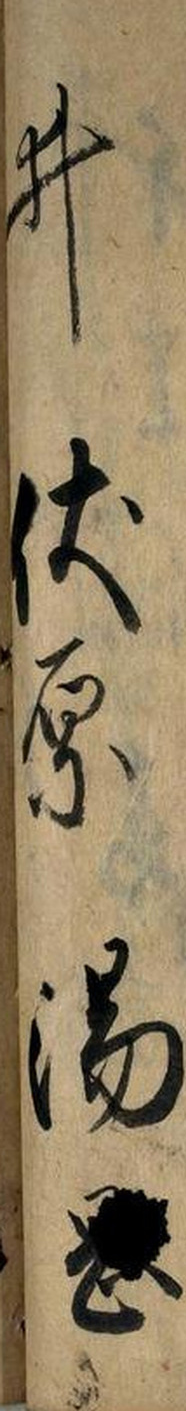井伏原湯岡
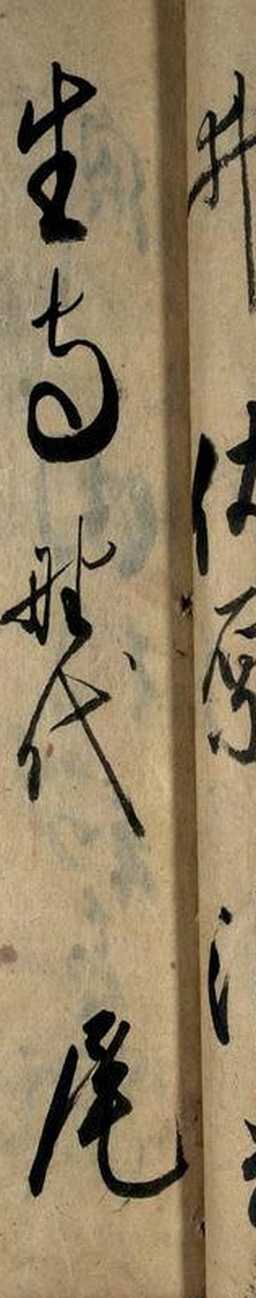生守野代尾
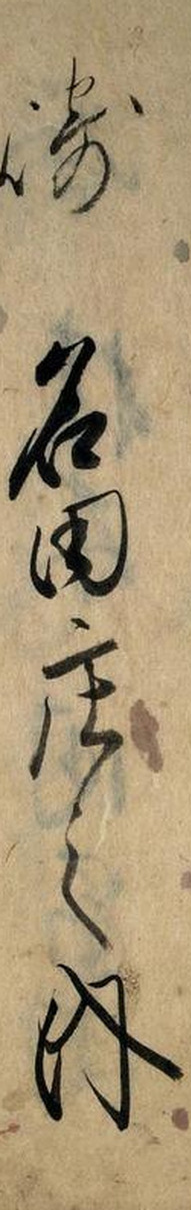嶋名田庄之内
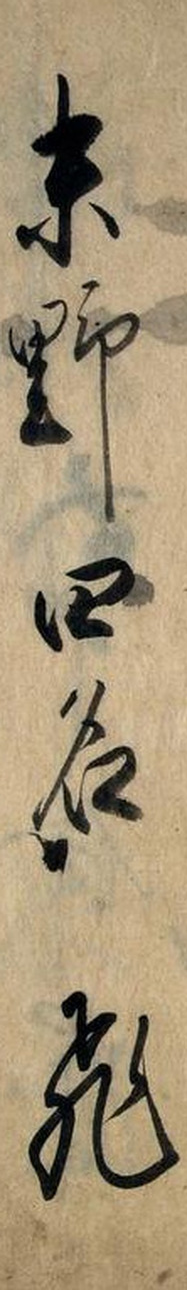末野四名飛

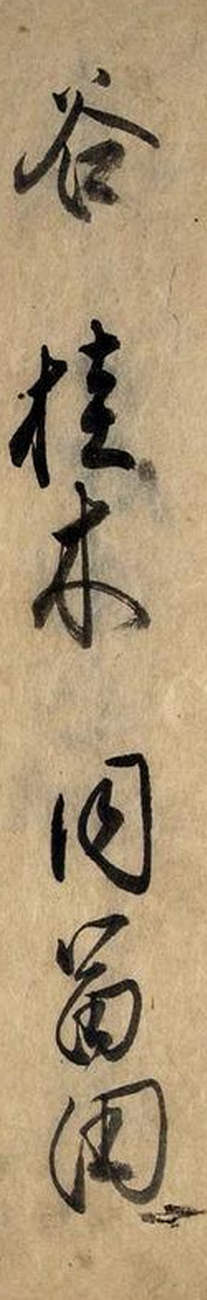谷桂木同富田
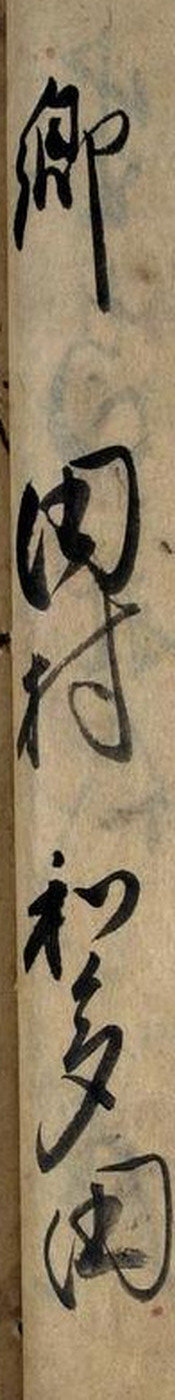郷田村和多田
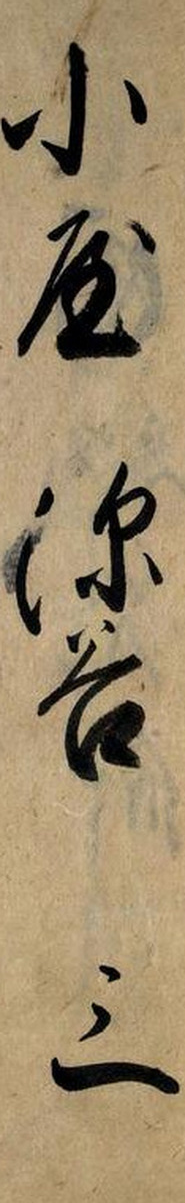小屋深谷三
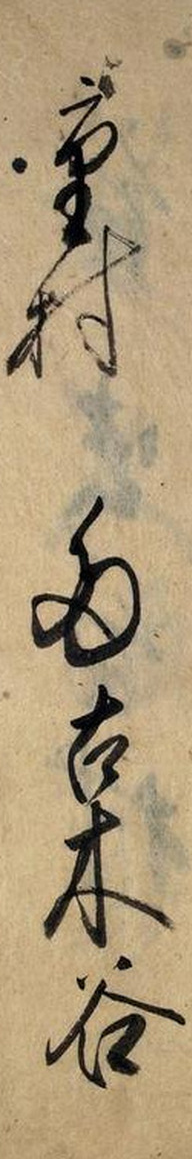里村多古木谷
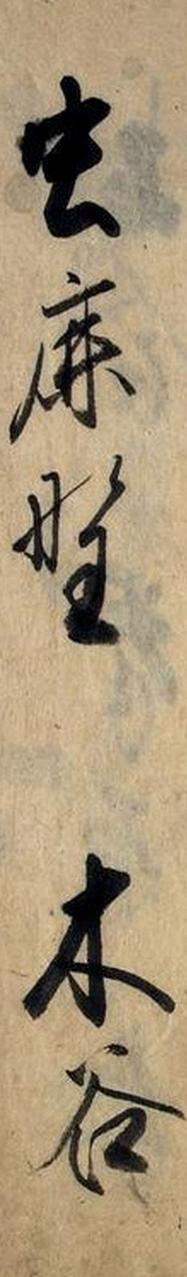虫鹿野木谷

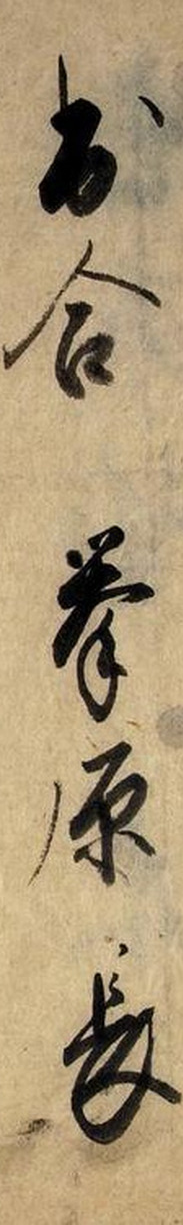出合挙原長
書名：御手本（手習、家号之事、小浜商家の屋号）
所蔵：福井県文書館 Fukui Prefectural Archives
